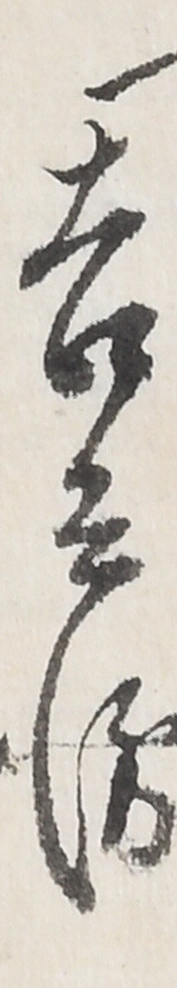吉兵衛
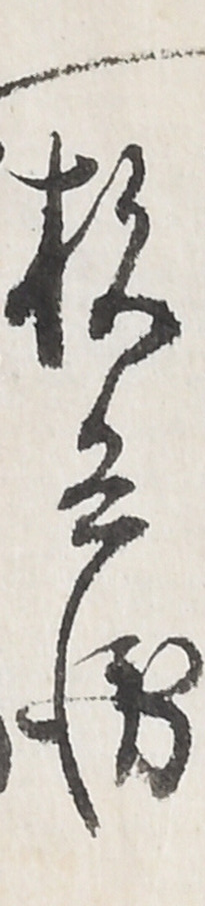杉兵衛
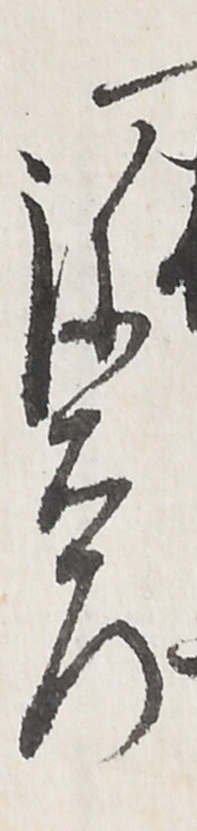弥右衛門
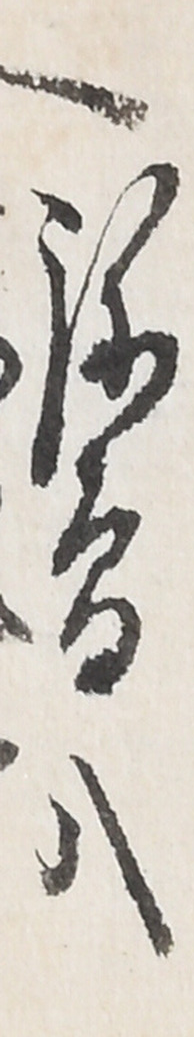弥曽八
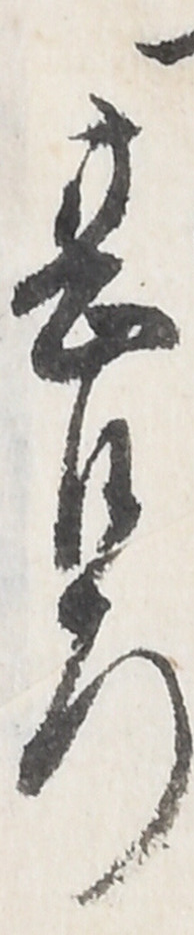甚左衛門
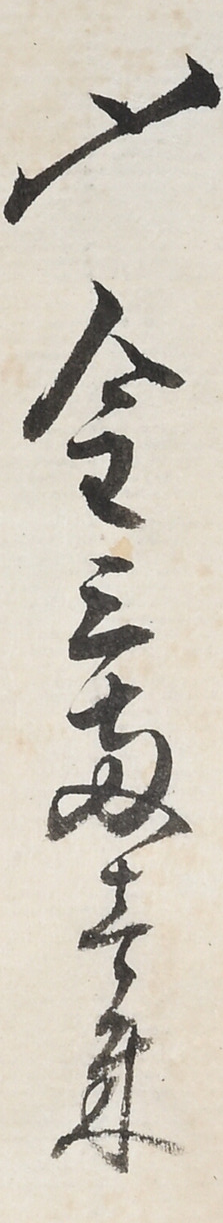〆金三両壱朱
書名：御拝地百五拾年御祝儀献上御目録名前
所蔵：伊那市立高遠町図書館・合同会社AMANE
